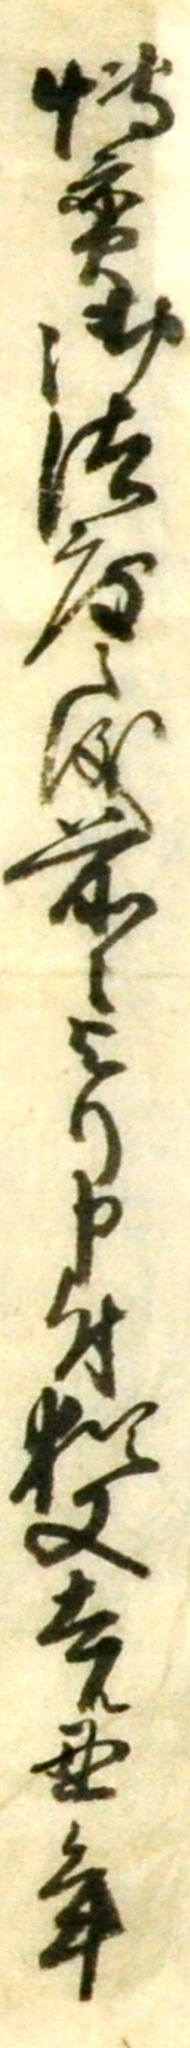博奕御法度之儀前々より申付猶又去ル丑年
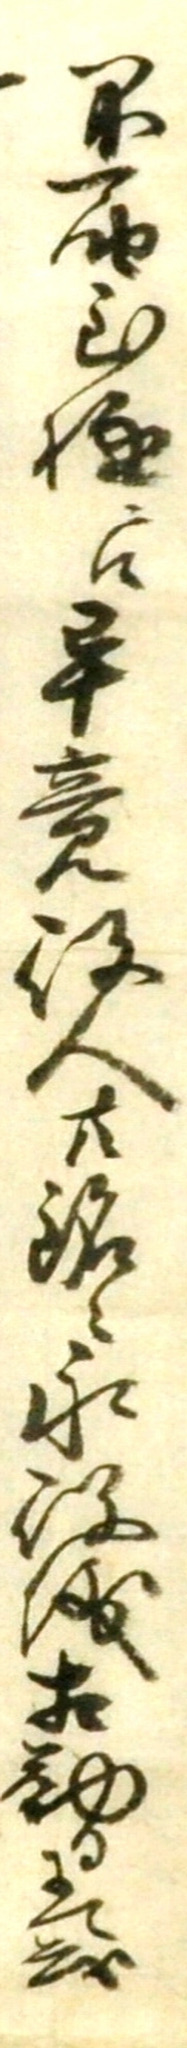不届至極ニ候畢竟役人共銘々永役儀相勤るにて茂
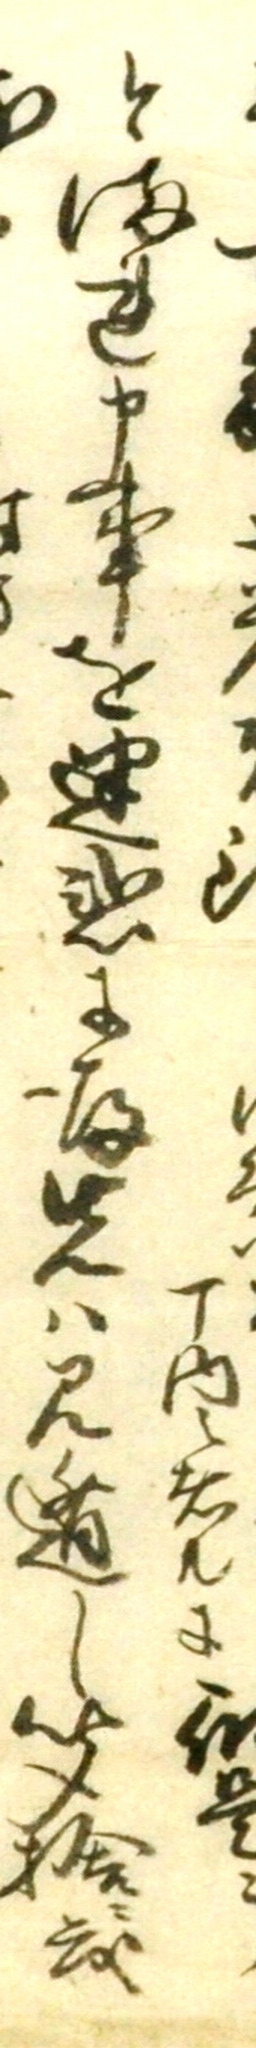とまれ申事を迷惑に存先ハ見遁し聞捨ニ茂
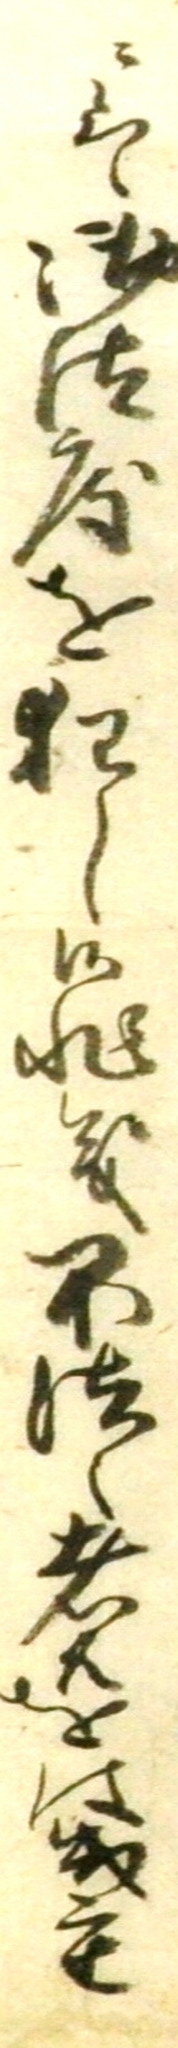ニ候ハヽ御法度を犯し候非義不法之者共をは幾重
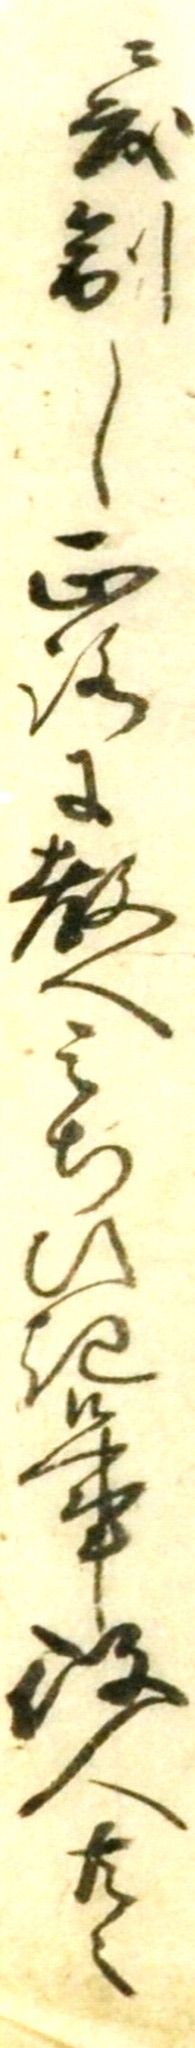ニ茂制し正路に教へミちひき候事役人共之

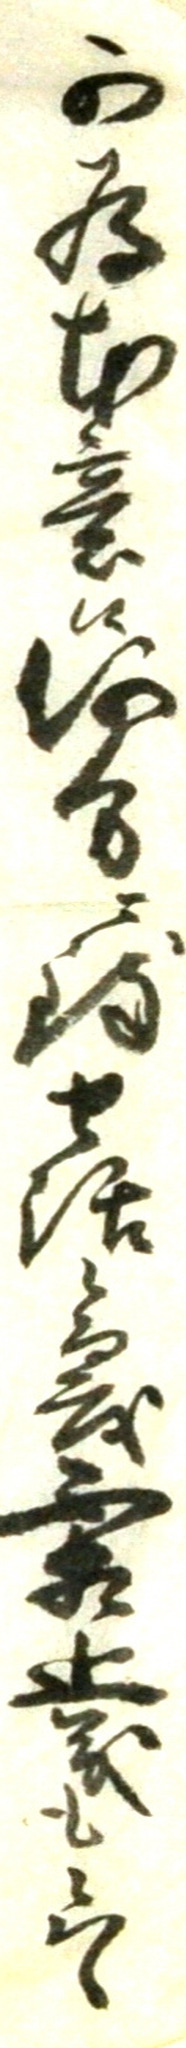可為本意候何分ニ致世話候而茂不相止義も候ハヽ
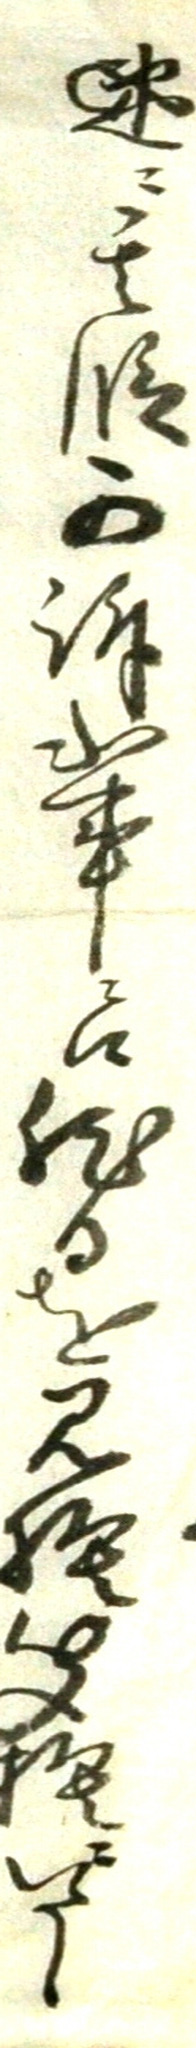速ニ其段可訴出事ニ候然るを見捨聞捨ニいたし
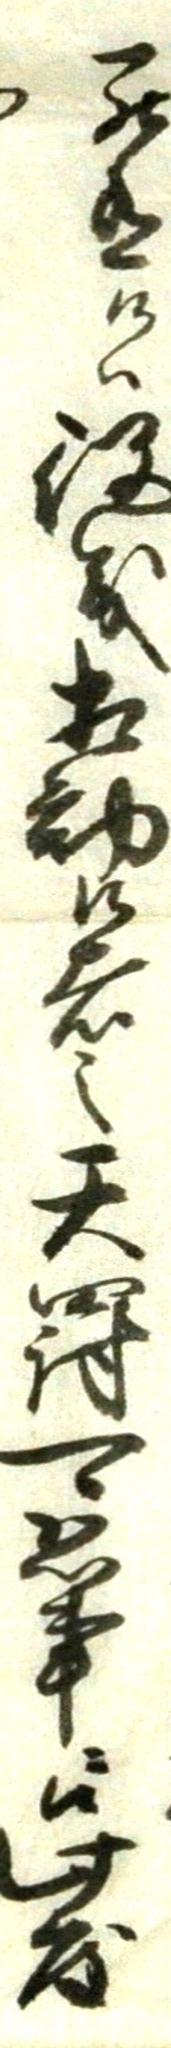罷有候ハ役儀相勤候者之天罰可恐事ニ候此度
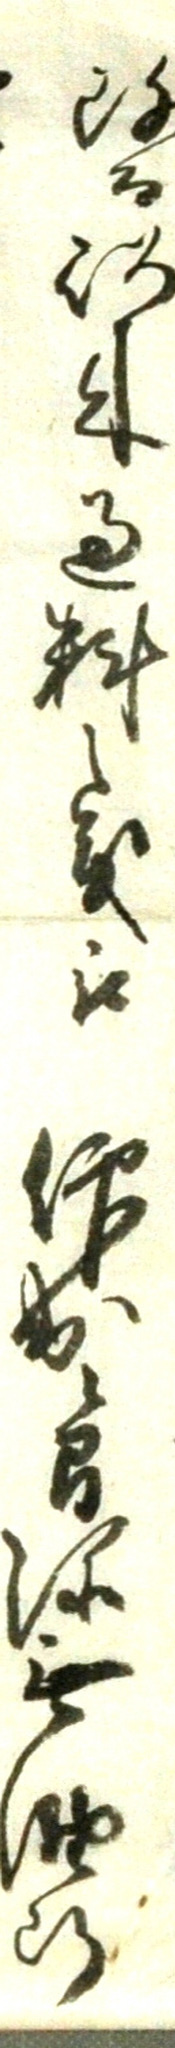改而以来過料之義被仰出候間弥無油断
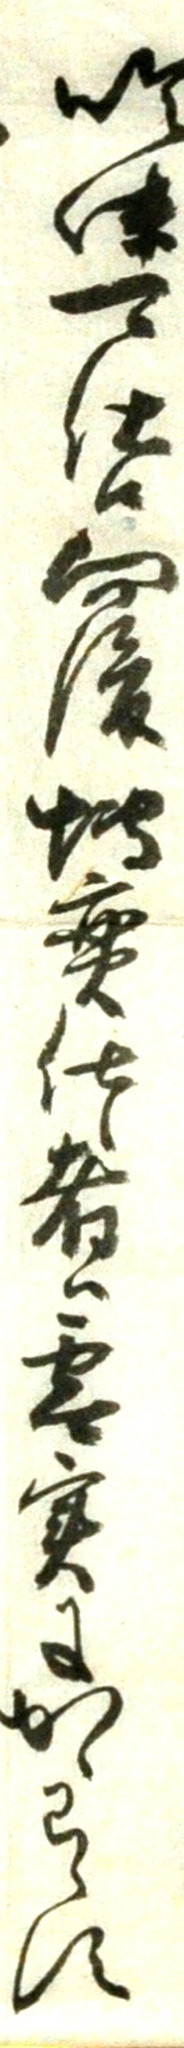吟味可仕候向後博奕仕候者ハ虚実にかゝわらす
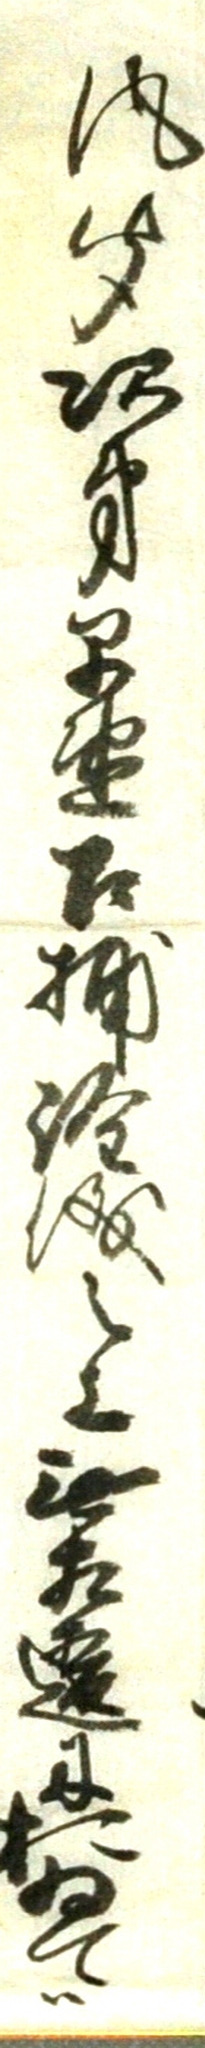風聞次第早速召捕詮儀之上無相違におゐてハ
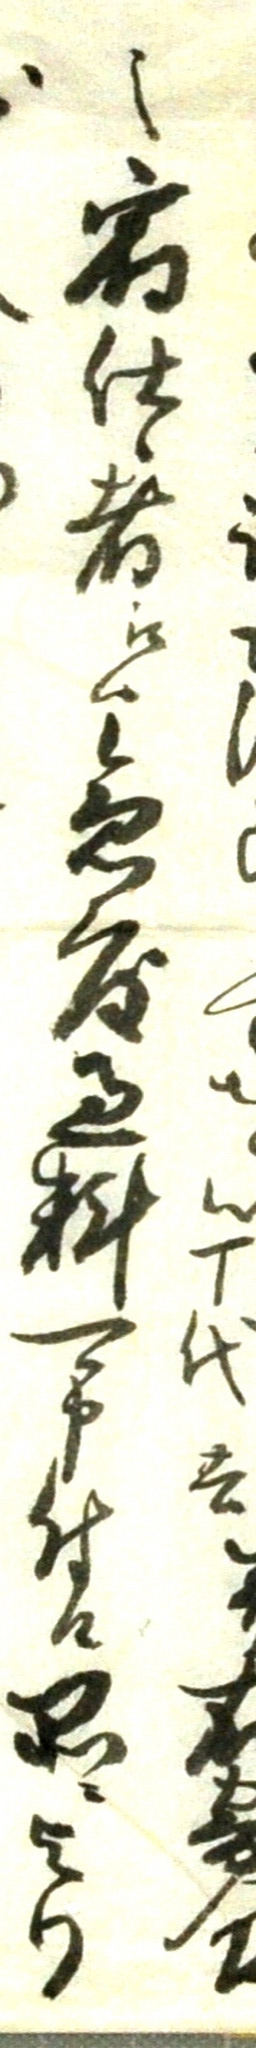之宿仕候者江ハ急度過料可申付候品ニより
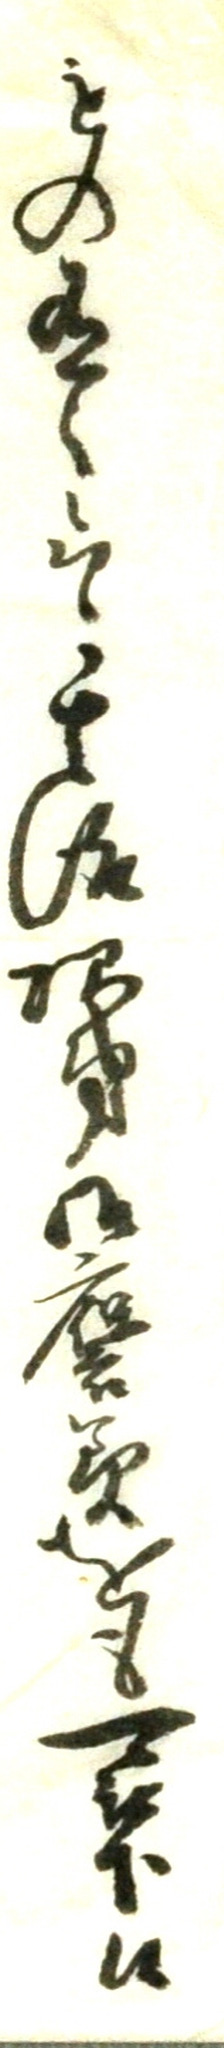もの有之候ハヽ其趣次第御褒美をも可被下候
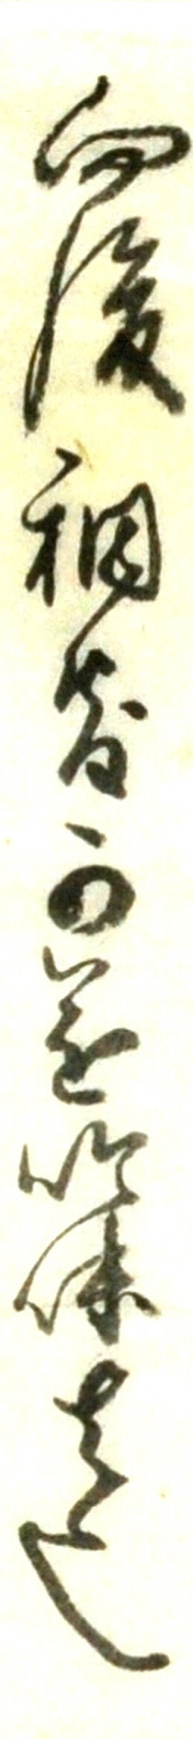向後敷可遂吟味者也
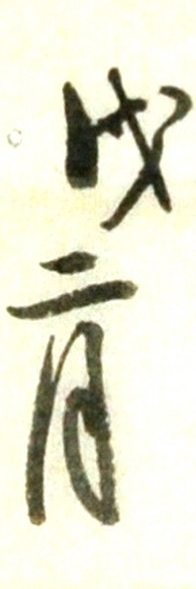戌二月

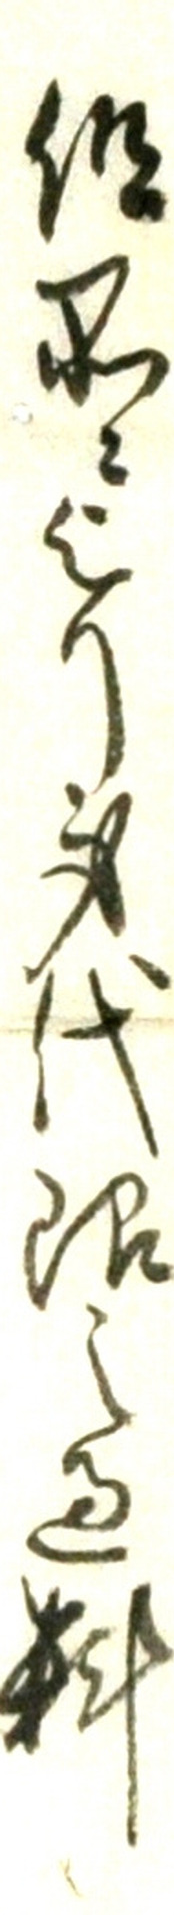但品ニより身代銀之過料
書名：留書
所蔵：伊那市立高遠町図書館・合同会社AMANE
